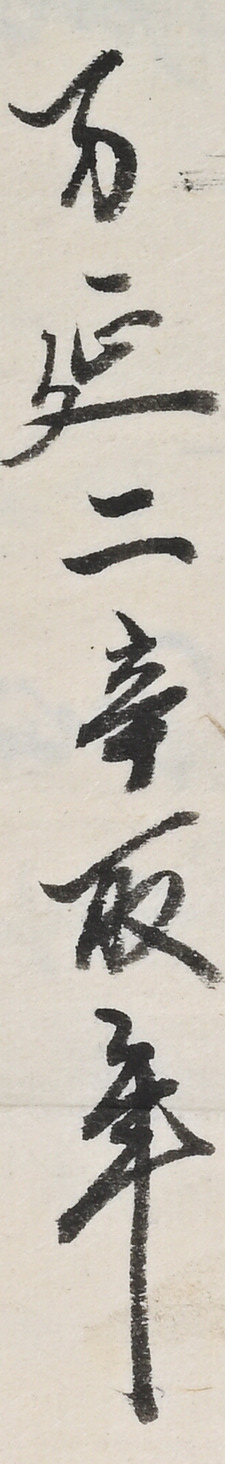㊞万延二辛取年
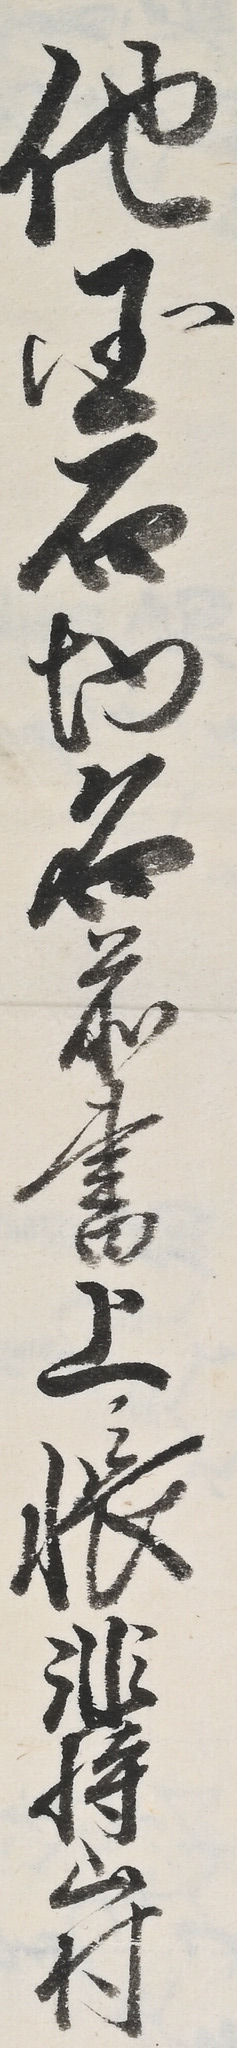他国石切名前書上帳非持山村

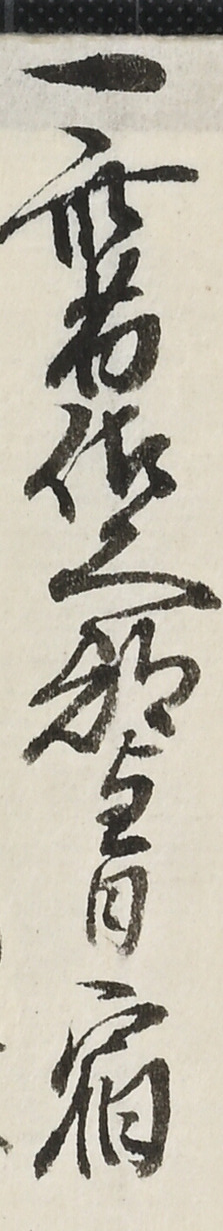一此者佐久郡望月宿

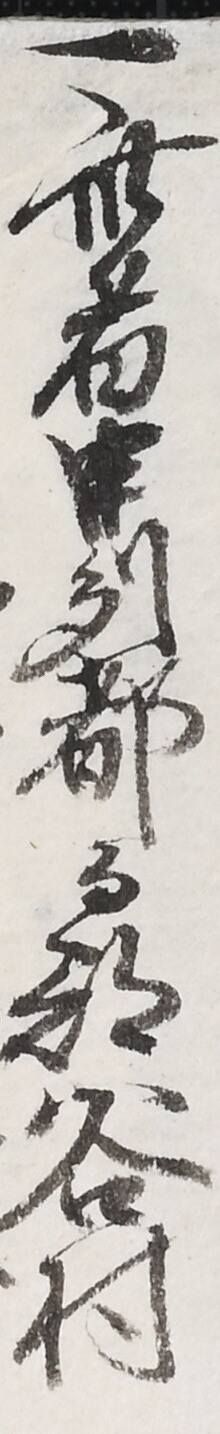一此者甲州都留郡谷村
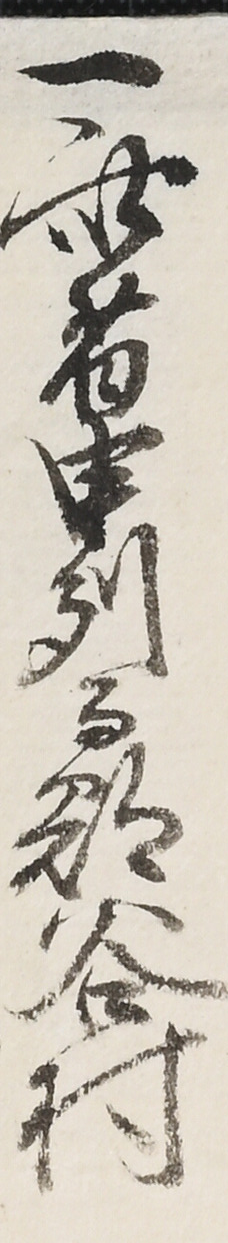一此者甲州都留郡谷村
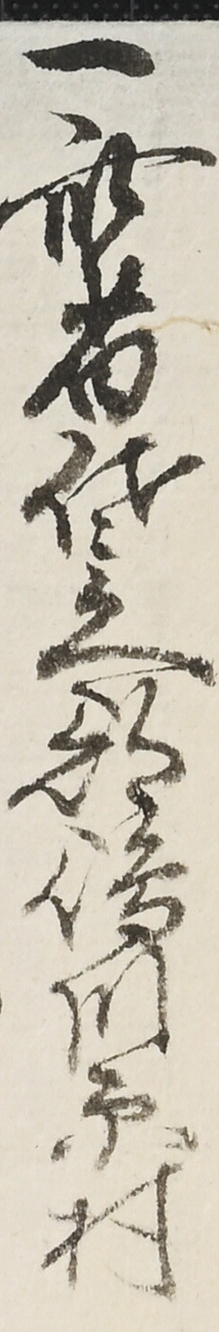一此者佐久郡島川原村
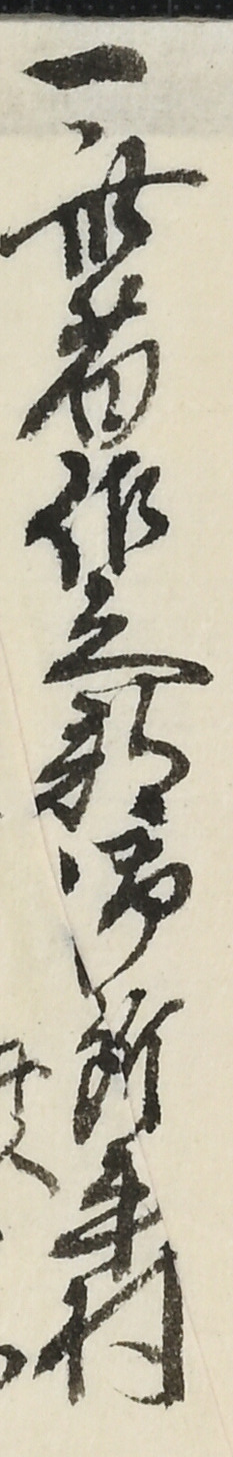一此者佐久郡御所平村
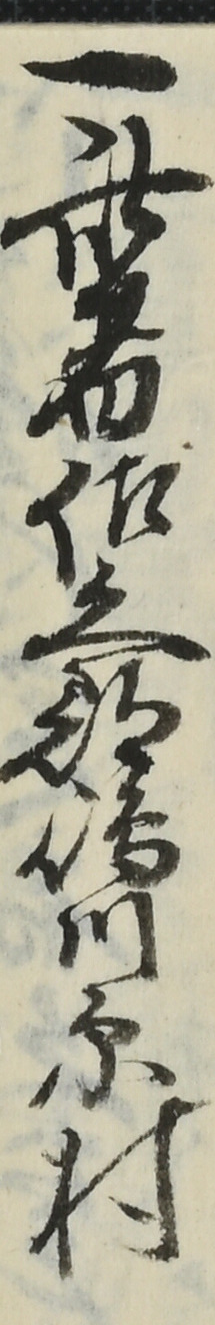一此者佐久郡島川原村

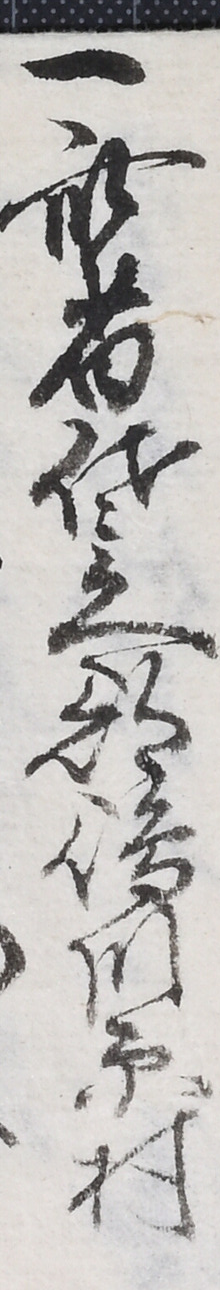一此者佐久郡島川原村
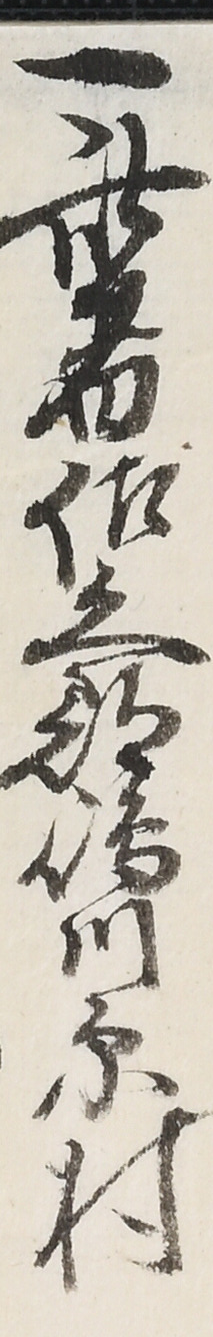一此者佐久郡島川原村
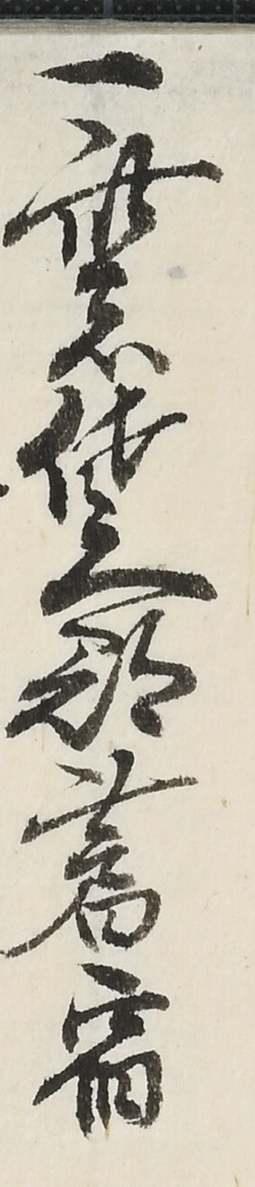一此者佐久郡芦田宿
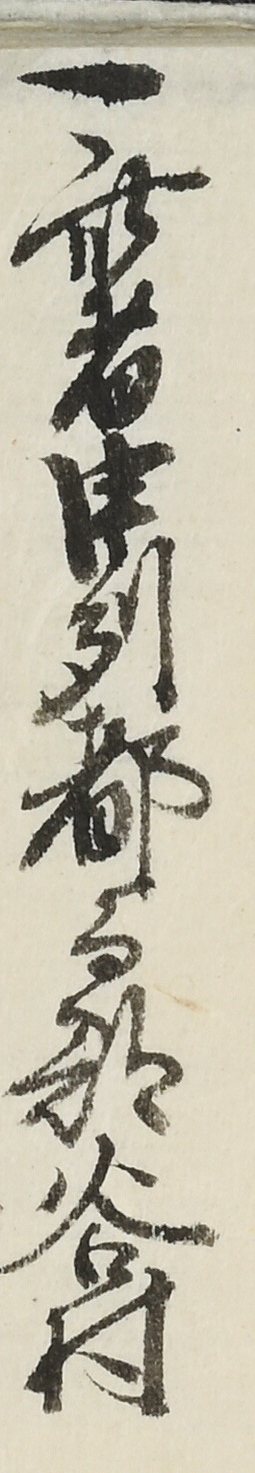一此者甲州都留郡谷村

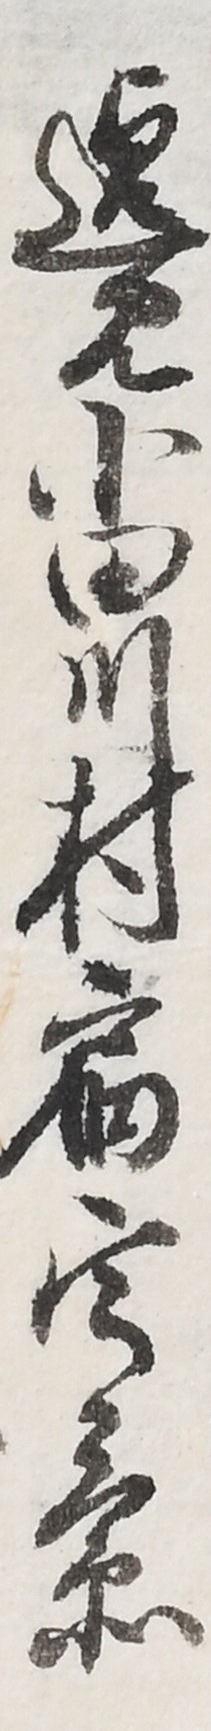逸見小田川村宿宇兵衛
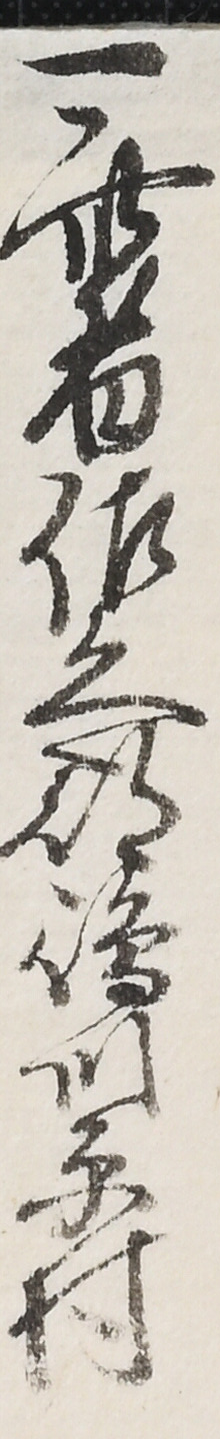一此者佐久郡島川原村
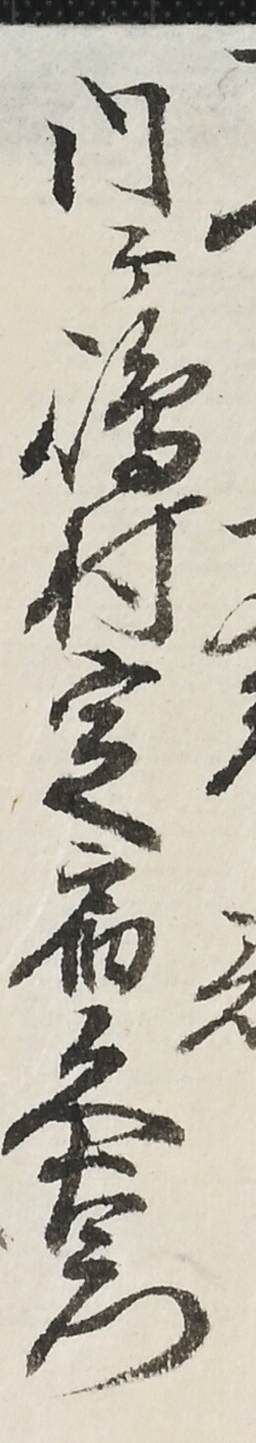内ヶ島村定宿久右衛門
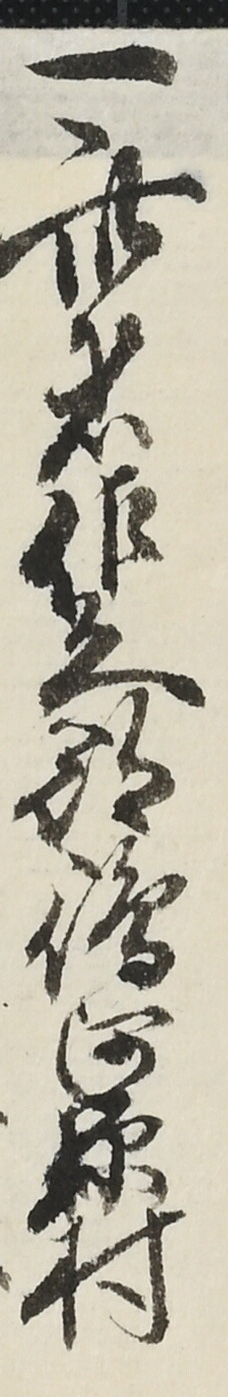一此者佐久郡島河原村
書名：萬延二年辛取（酉）年正月他国石切名前書上帳
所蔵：伊那市立高遠町図書館・合同会社AMANE
